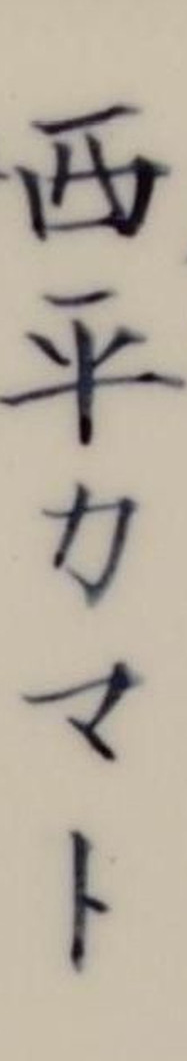西平カマト
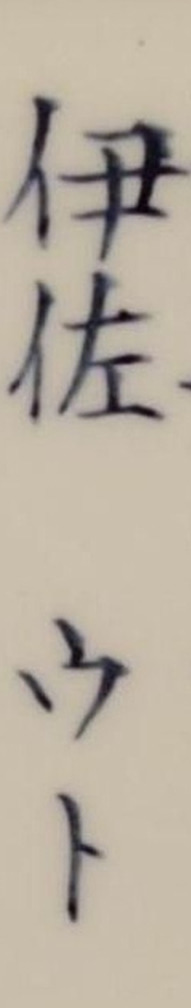伊佐ウト
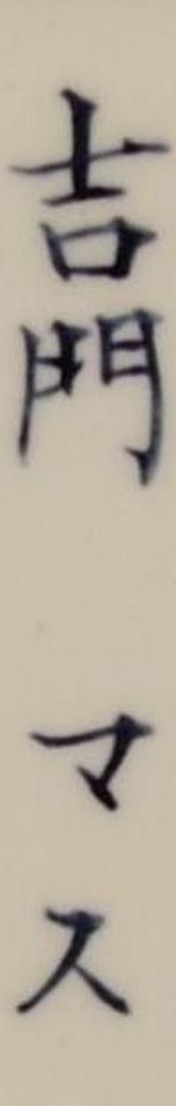吉門マス
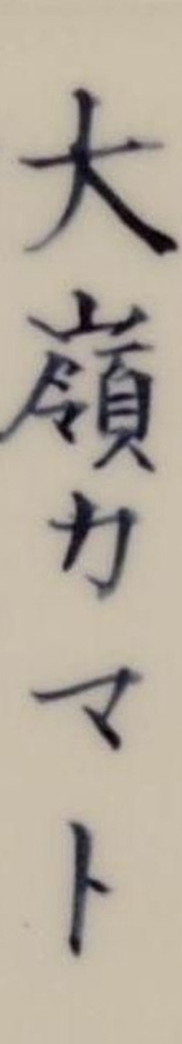大嶺カマト
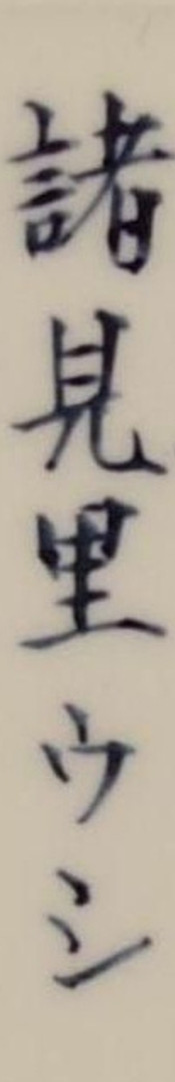諸見里ウシ
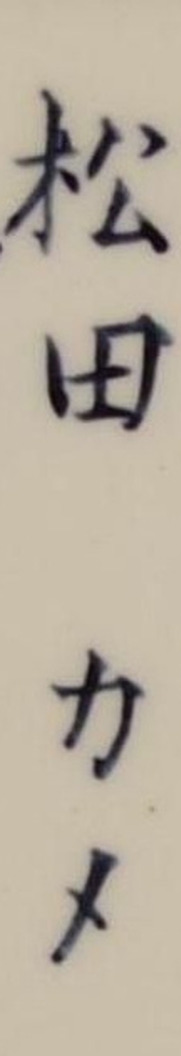松田カメ
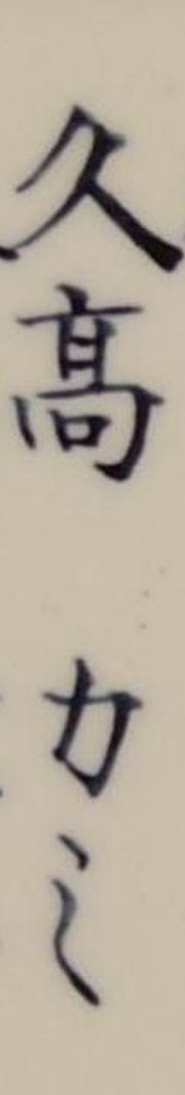久高力ミ
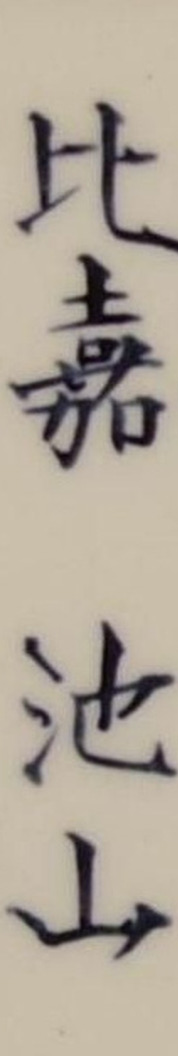比嘉池山
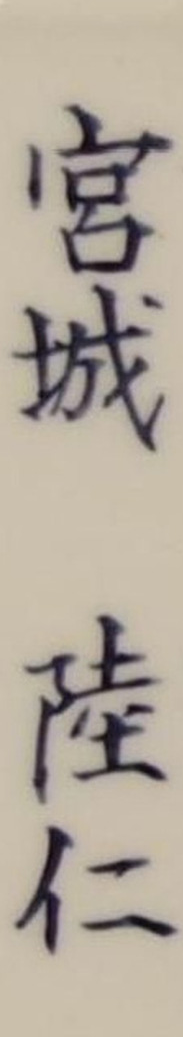宮城陸仁
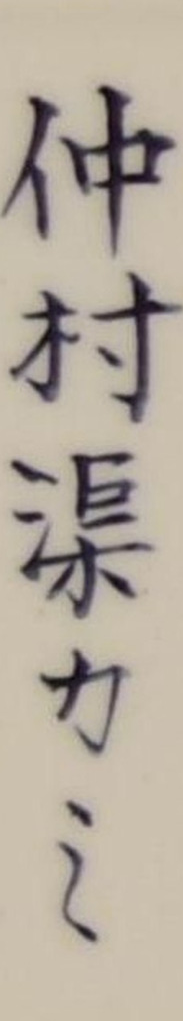仲村渠力之
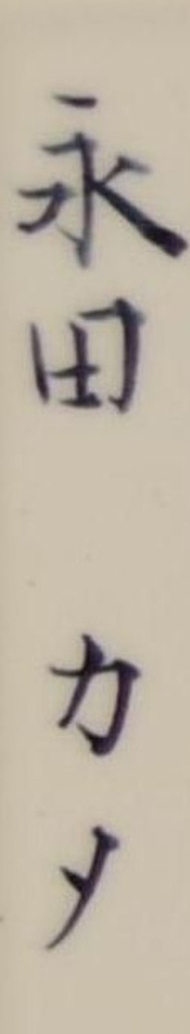永田カメ

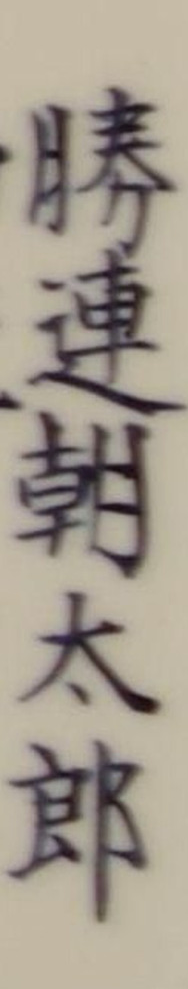勝連朝太郎
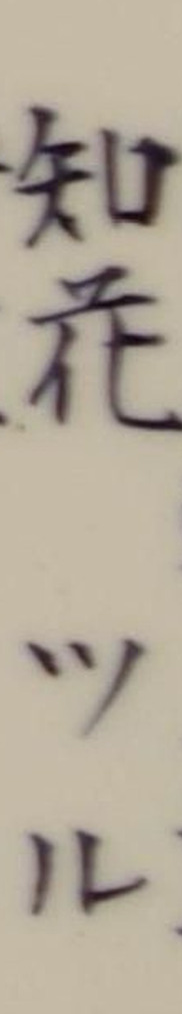知花ツル
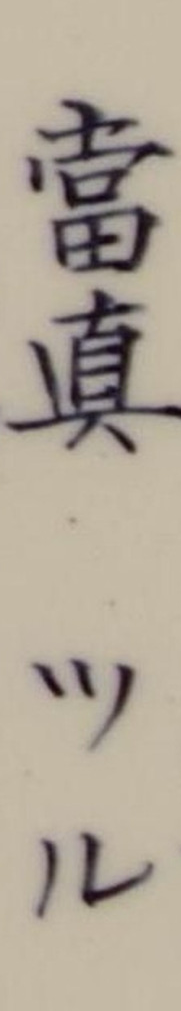当真ツル
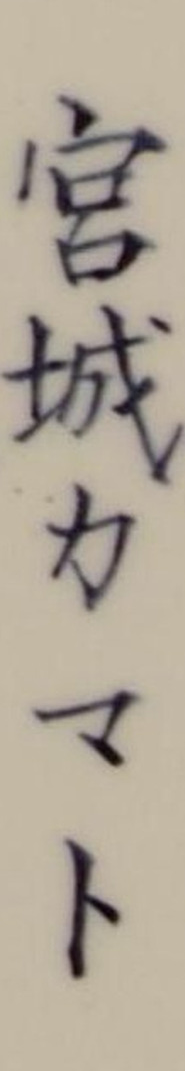宮城カマト
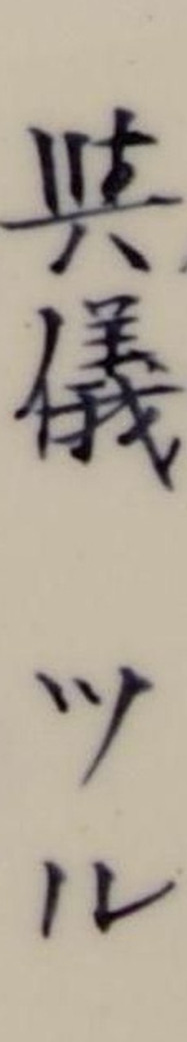與儀ツル
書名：E~L
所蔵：高野山金剛峯寺
